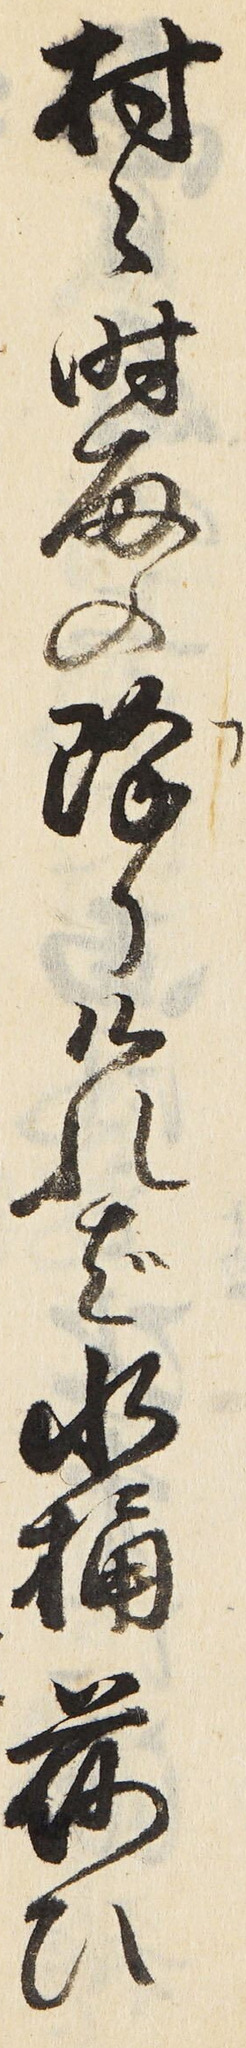村々時雨の降りければ水桶荷ひ
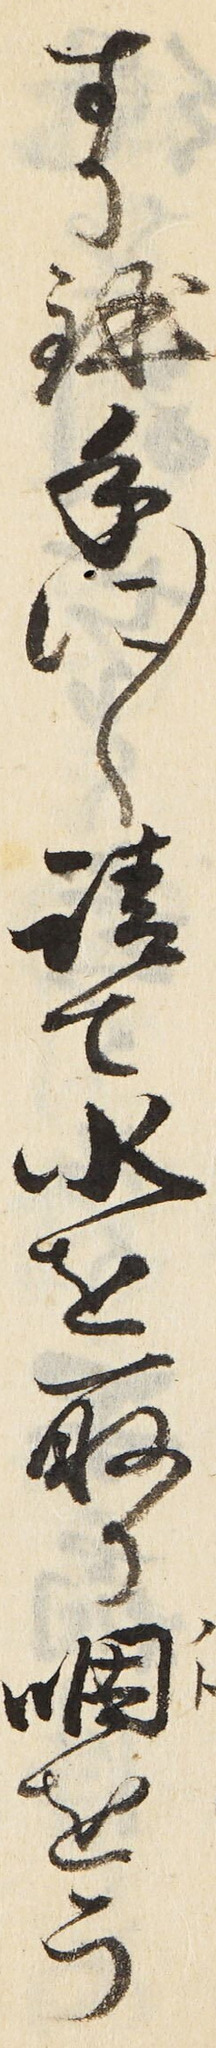すり鉢手に〳〵請て水を取り咽をう
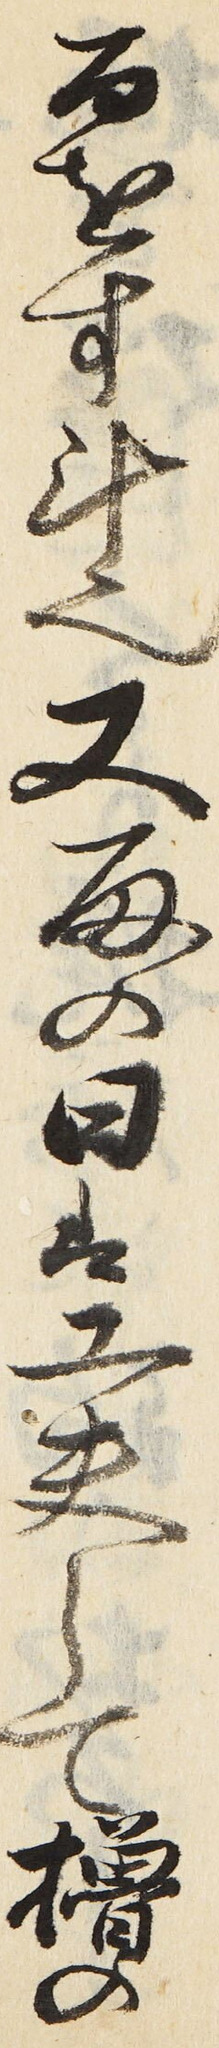るをす計也又雨の日は工夫して櫓の
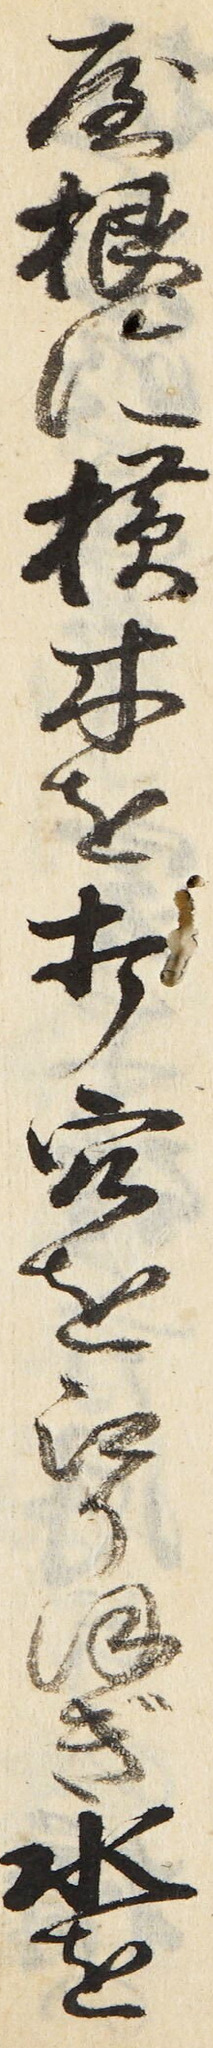屋根に横木を打穴をえりほぎ水を
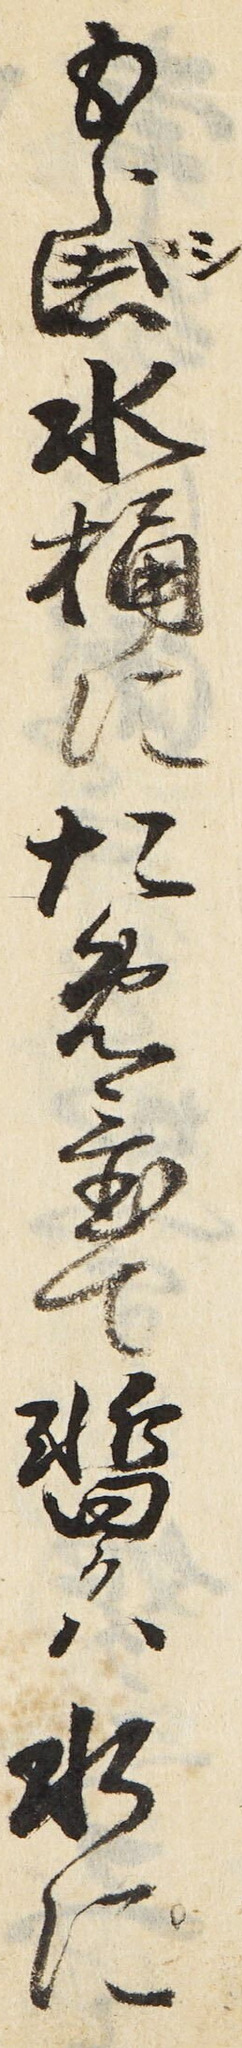もらし水桶にため置て暫くは水に
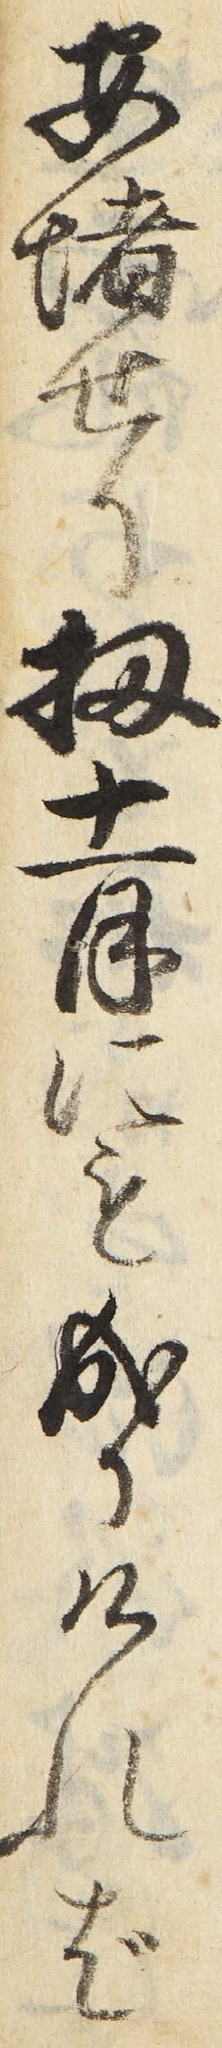安堵せり扨十一月にも成りければ

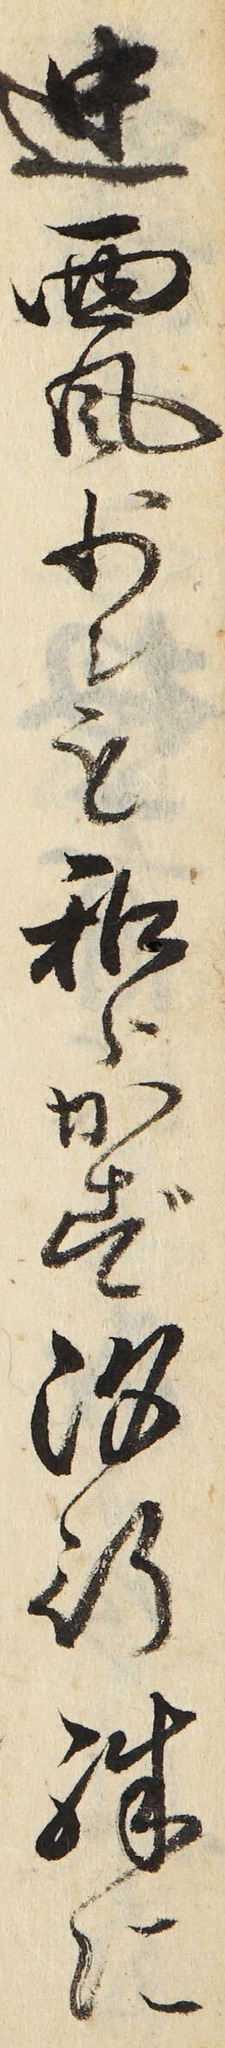迚雨風少も和らかず汐行誠に
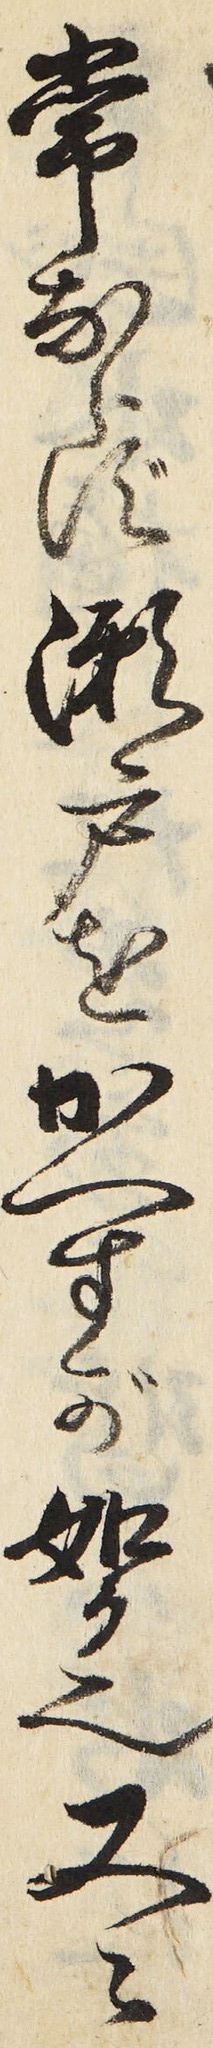常ならず瀬戸をかへすが如く也又々
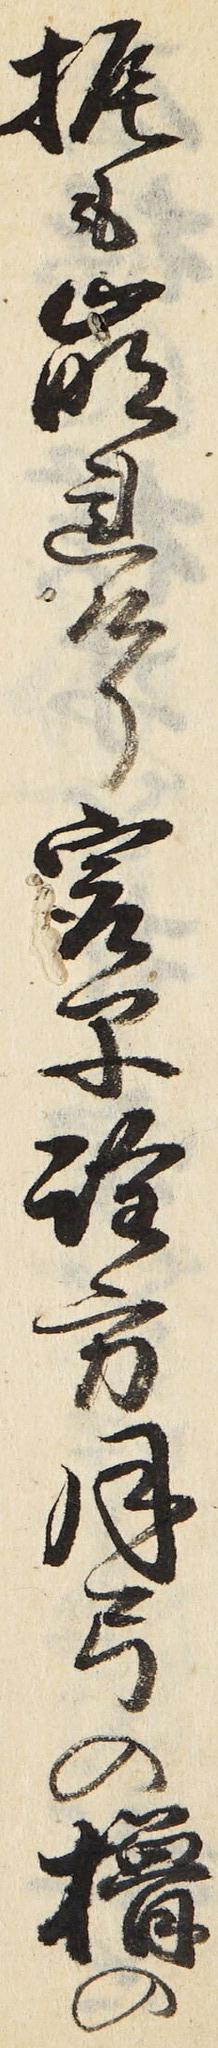梶も崩れけり最早詮方月弓の櫓の
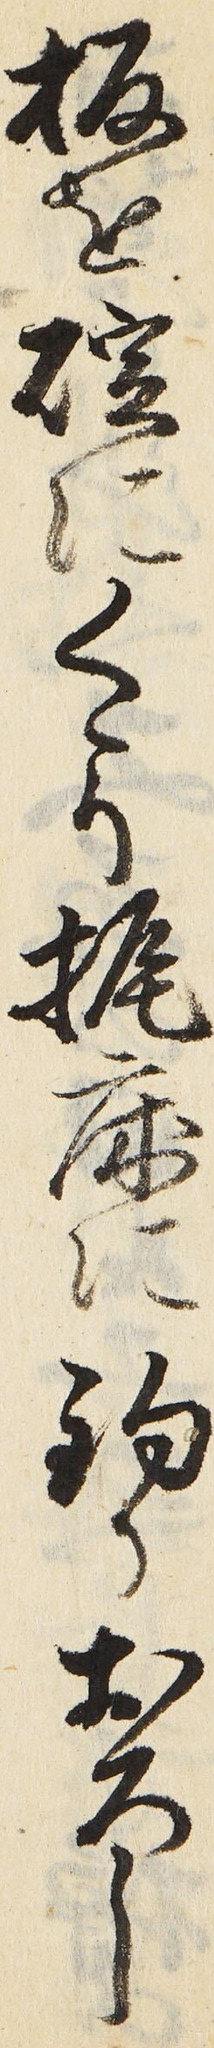板を碇にくゝり梶床に釣りおろし
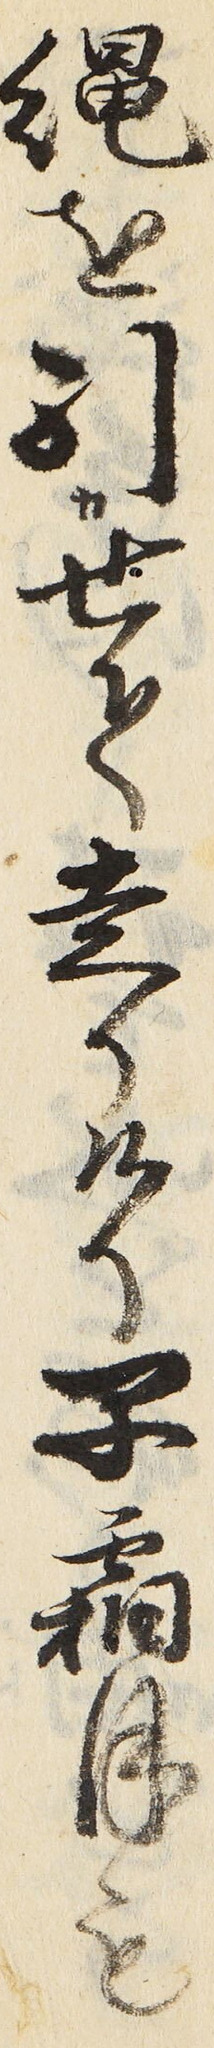縄を引かせて走りけり早霜月も
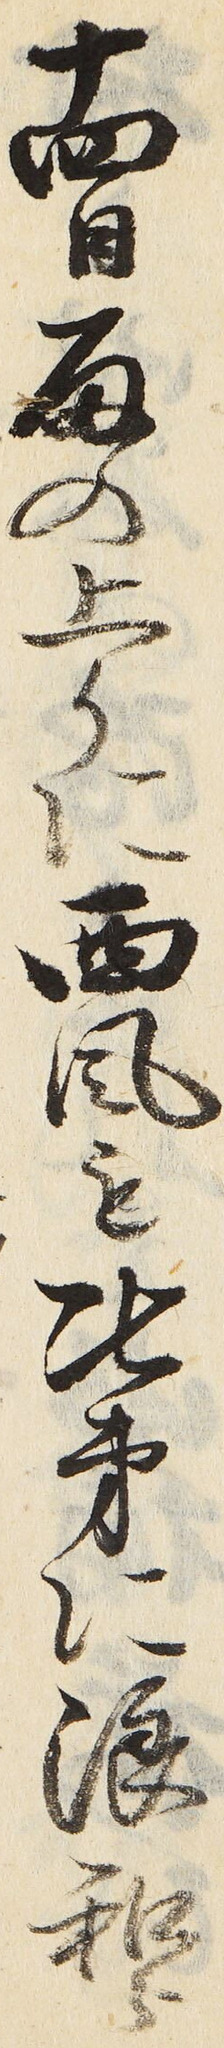十四日雨の上りに西風も次第に浪和ら
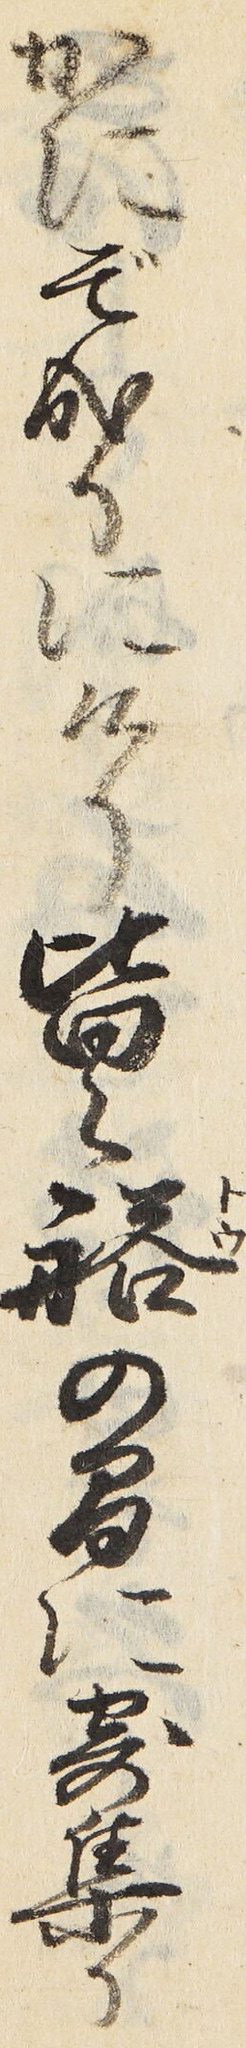かにぞ成りにけり皆々の間に寄集り
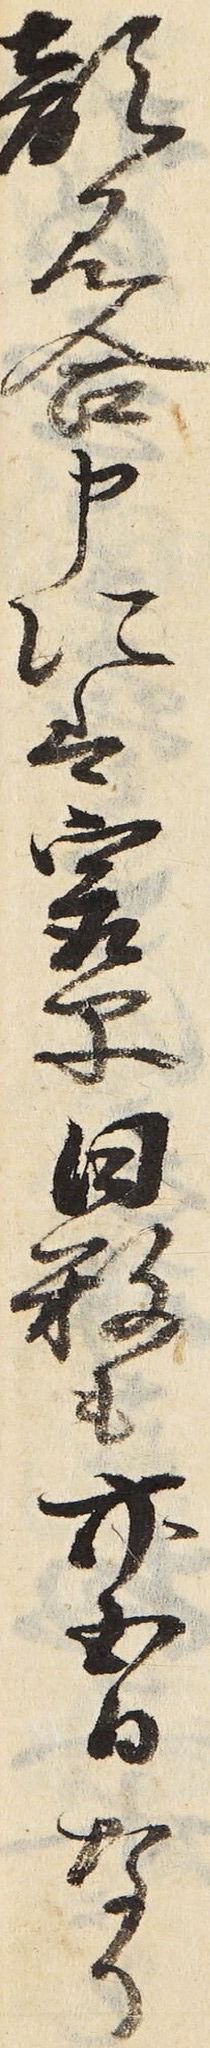顔見合申には最早日数も廿五日なり
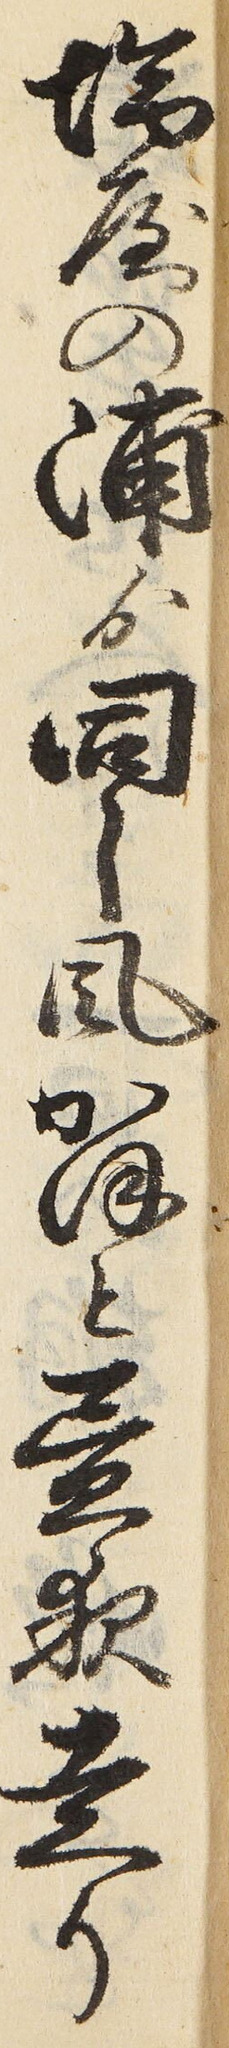塩屋の浦ゟ同し風かほと昼夜走り
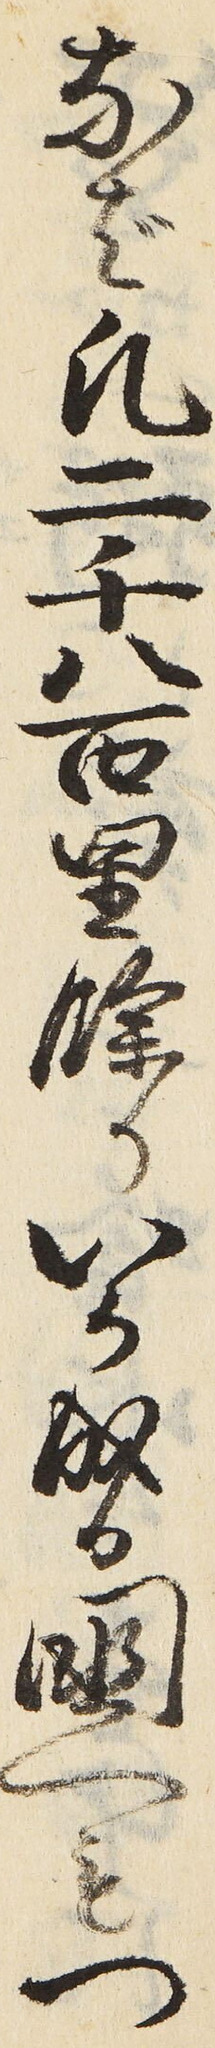なば凡二千八百里余りいか成る国へもつ
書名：華夷九年録
